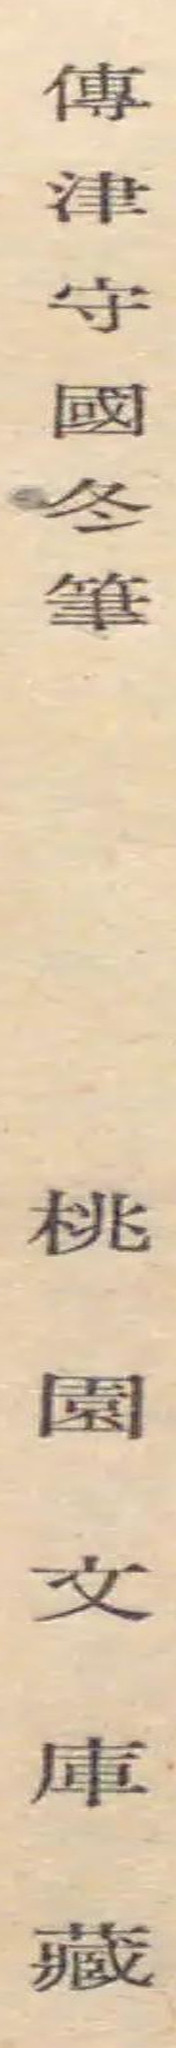冬伝津守国冬筆桃園文庫蔵
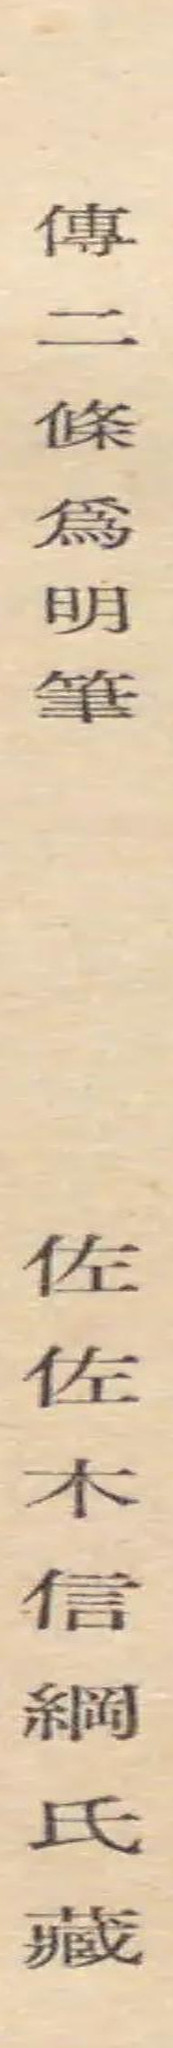佐伝二条為明筆佐佐木信綱氏蔵
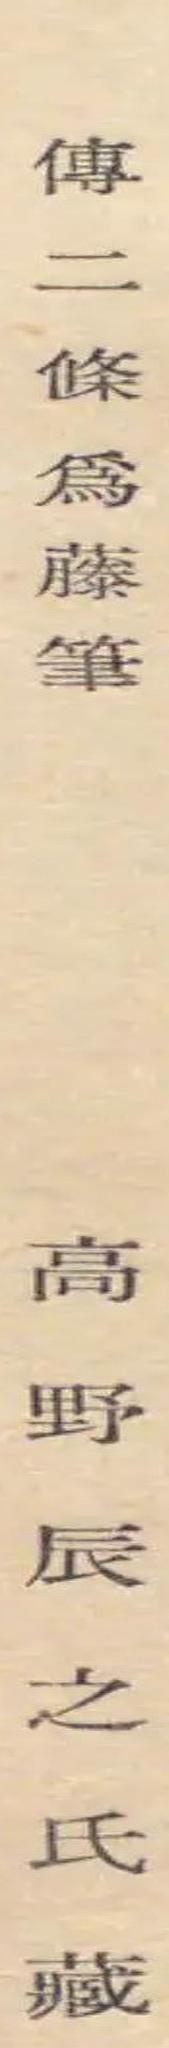高伝二条為藤筆高野辰之氏蔵
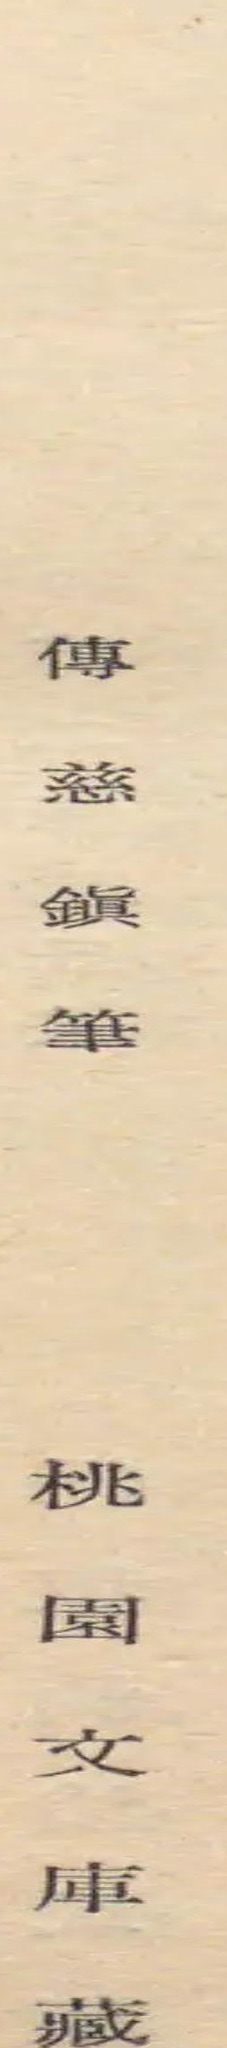鎮伝慈鎮筆桃園文庫蔵
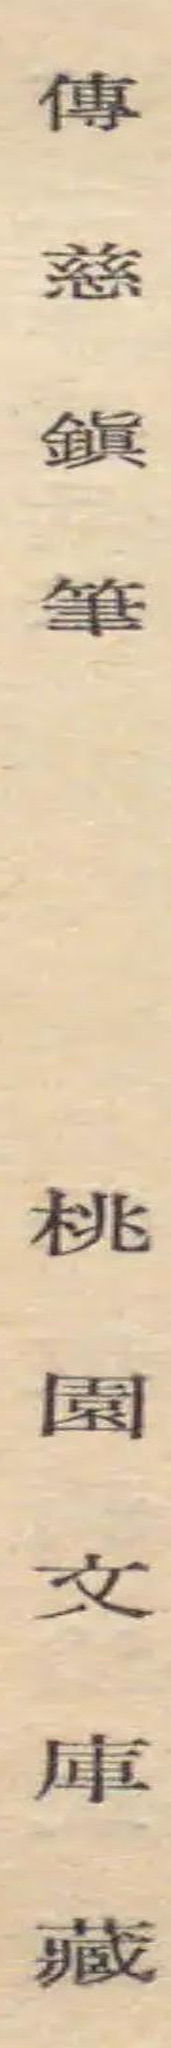鎮伝慈鎮筆桃園文庫蔵
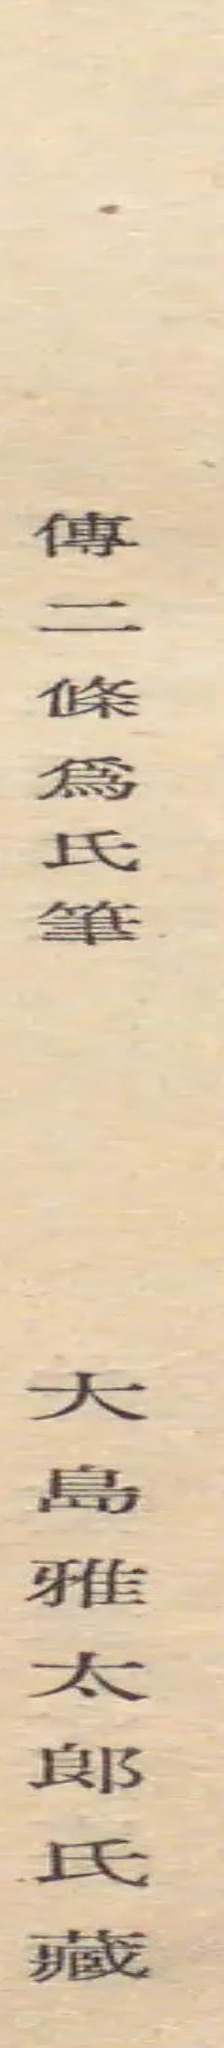氏伝二条為氏筆大島雅太郎氏蔵
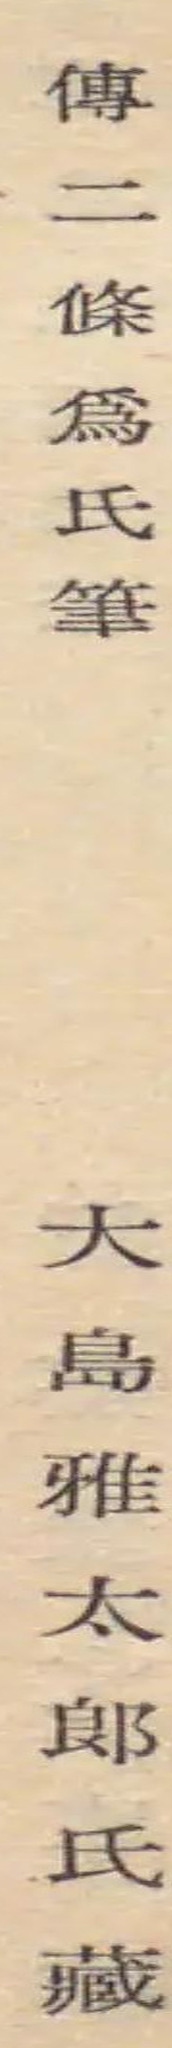氏伝二条為氏筆大島雅太郎氏蔵
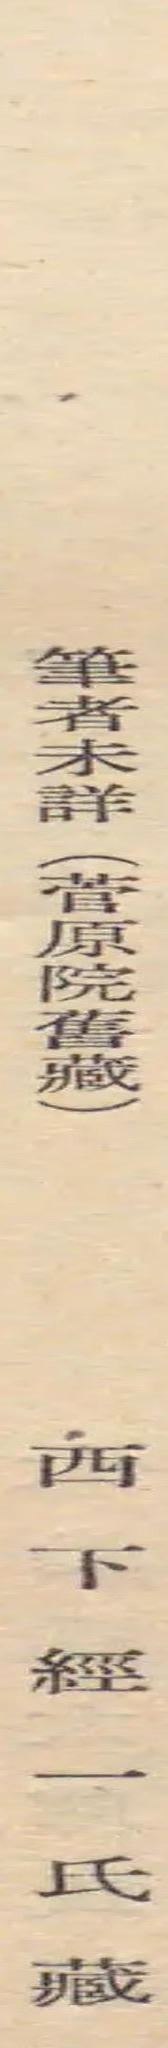西筆者未詳(菅原院旧蔵)西下経一氏蔵
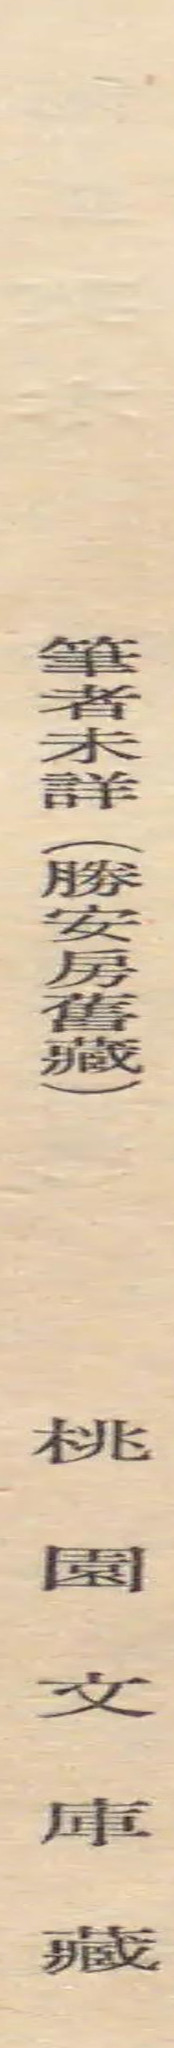勝筆者未詳(勝安房旧蔵)桃園文庫蔵
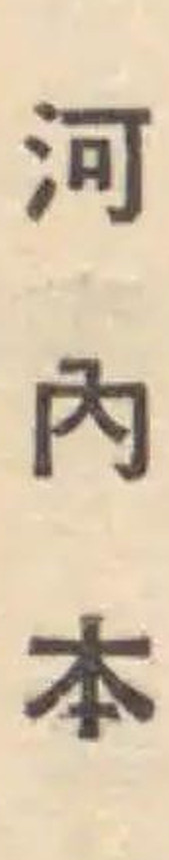河内本
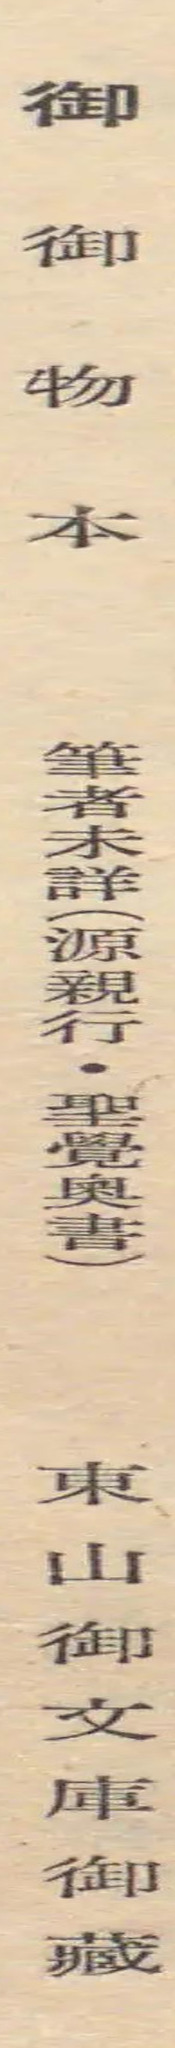御御物本筆者未詳(源親行・聖覚奥書)東山御文庫御蔵
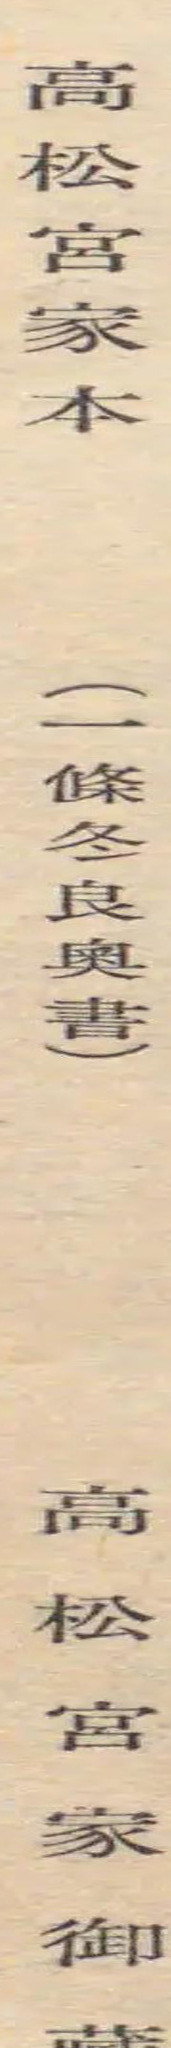宮高松宮家本(一条冬良奥書)高松宮家御蔵
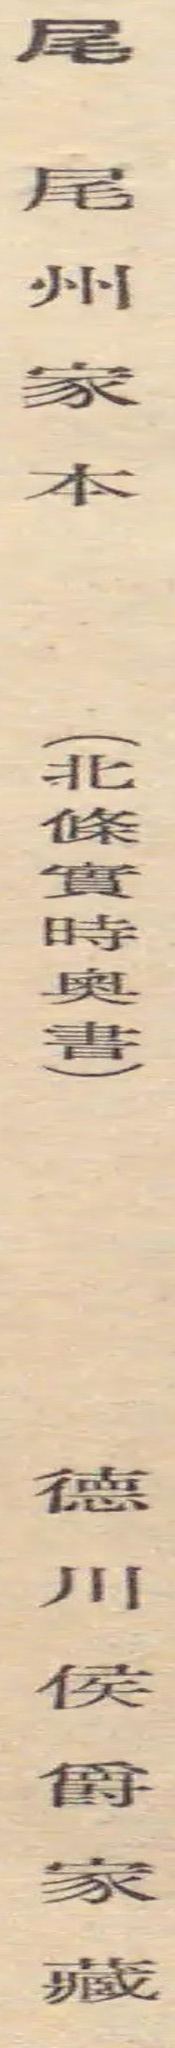尾尾州家本(北条実時奥書)徳川侯爵家蔵
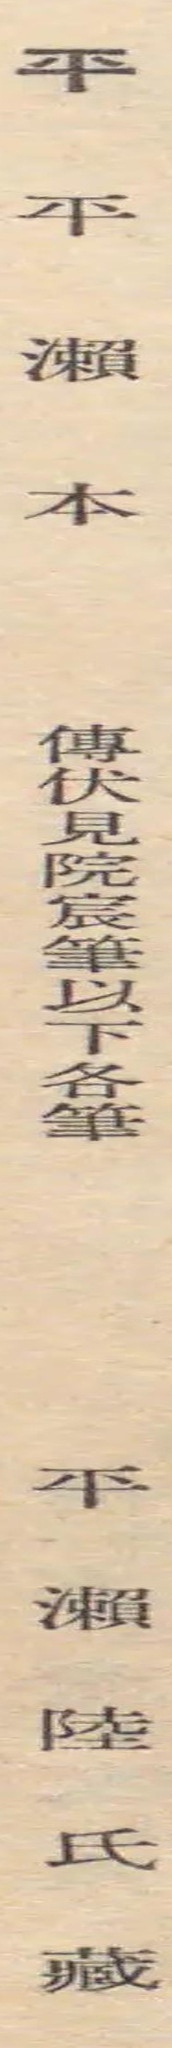平平瀬本伝伏見院宸畢以下各筆平瀬陸氏蔵
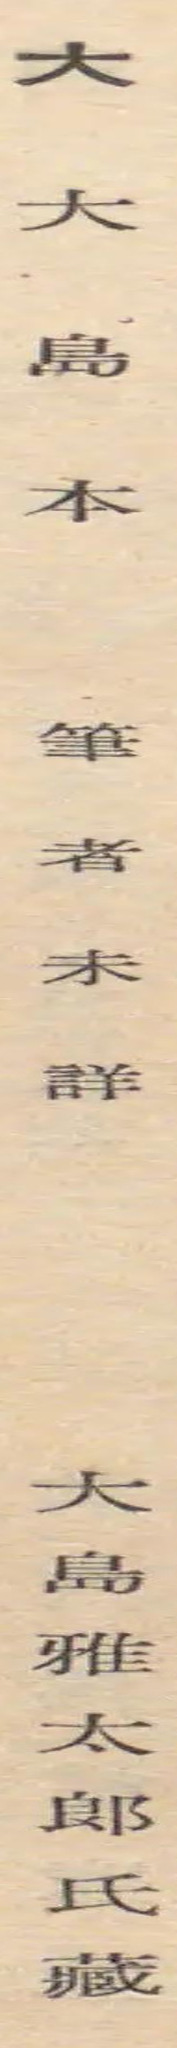大大島本筆者未詳大島雅太郎氏蔵
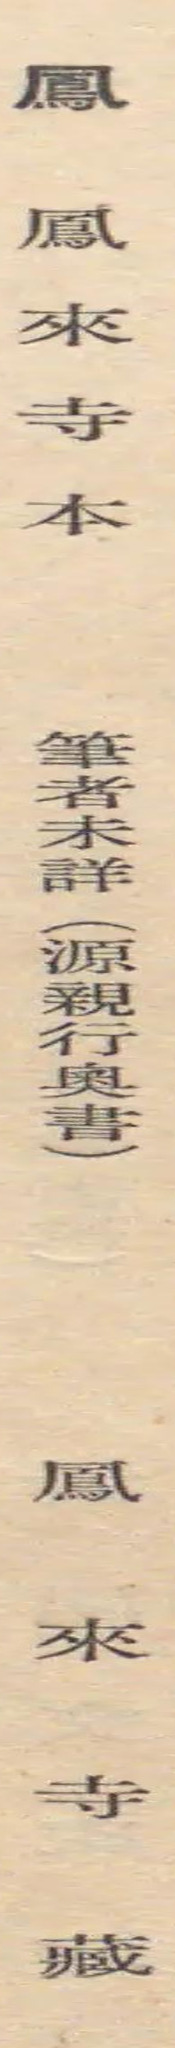鳳鳳来寺本筆者未詳(源親行奥書)鳳来寺蔵
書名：校異源氏物語.
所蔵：国立国会図書館 National Diet Library, JAPAN
